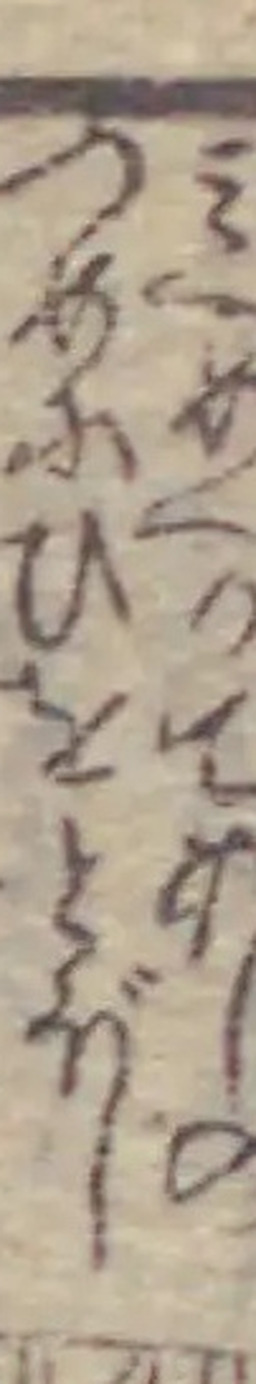つめにひをとぼし
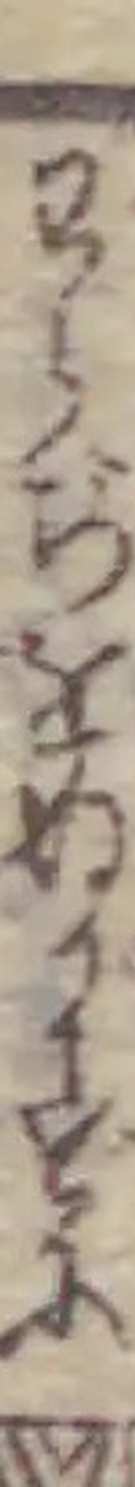わらぢをぬがすに
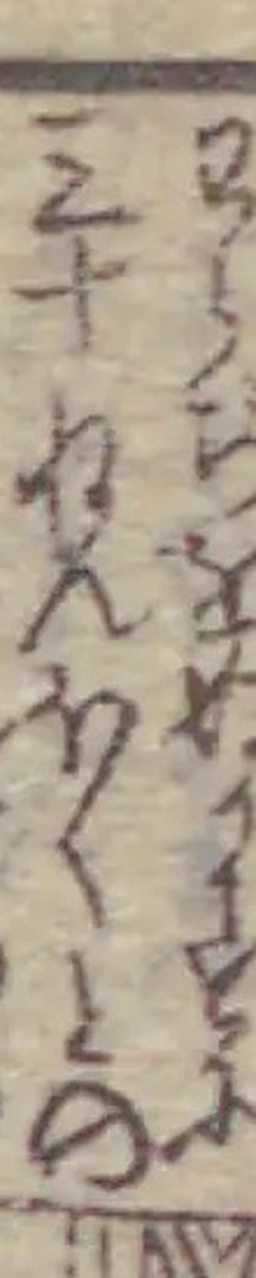三十ねんほくとの
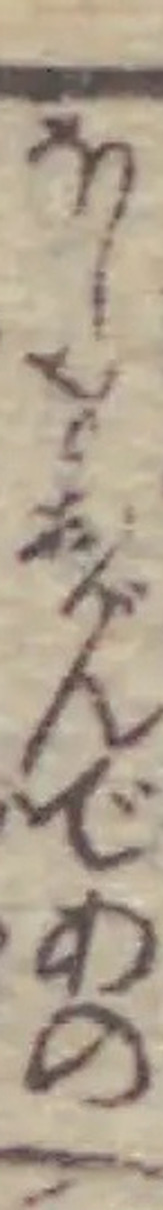ほしをおがんであの
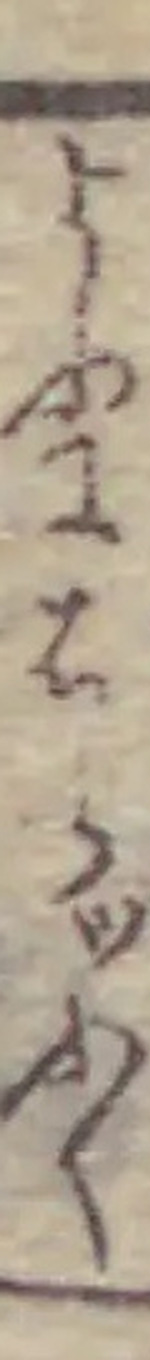よふにはらっふく
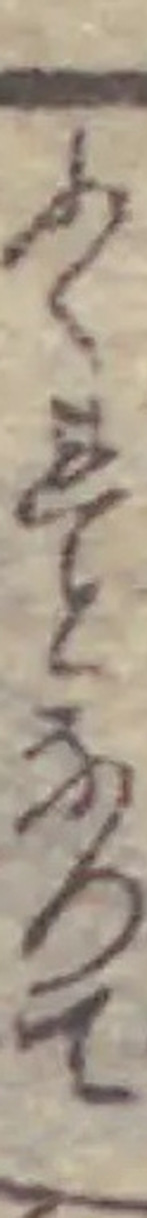ふくれとなつて
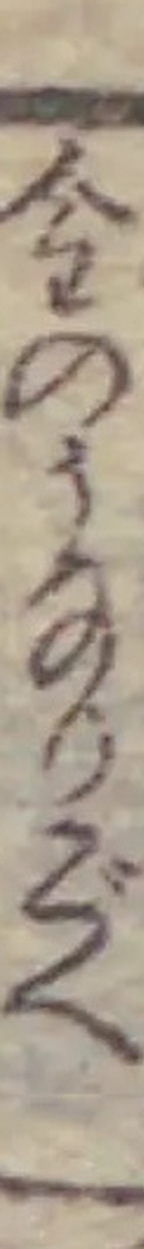金のうなりごへ
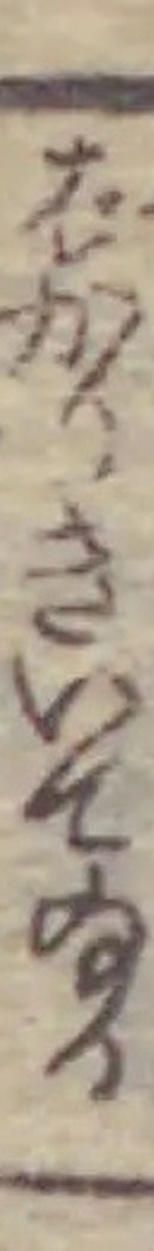ばかりきいてゐる
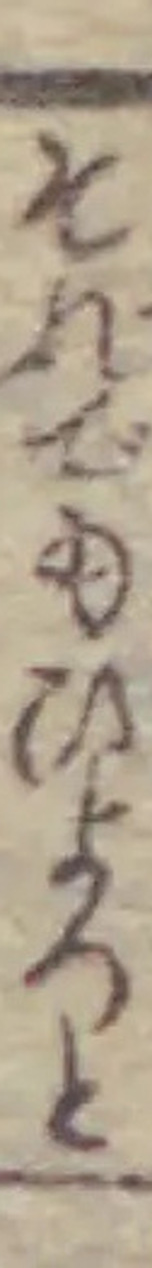それでもひよつと
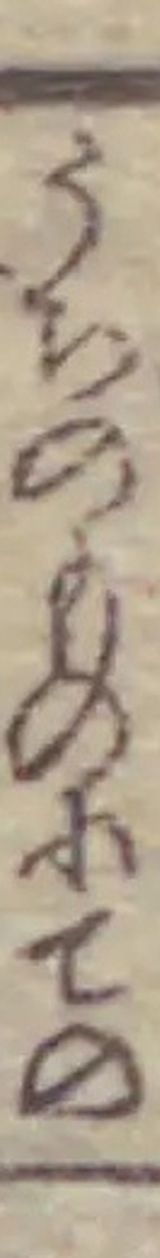うちのものにての
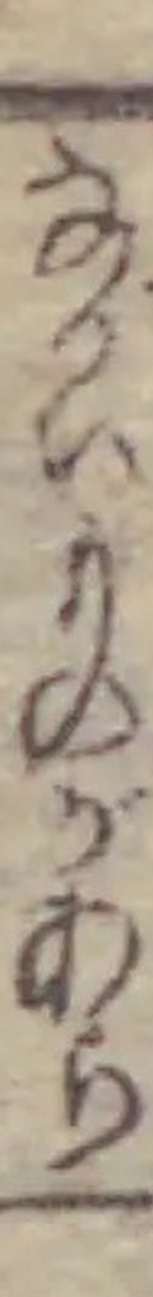なかいものがあら
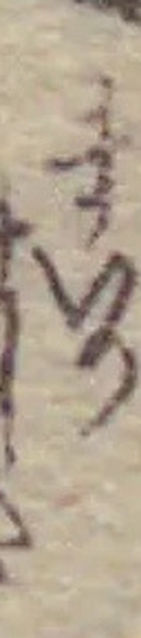まいり
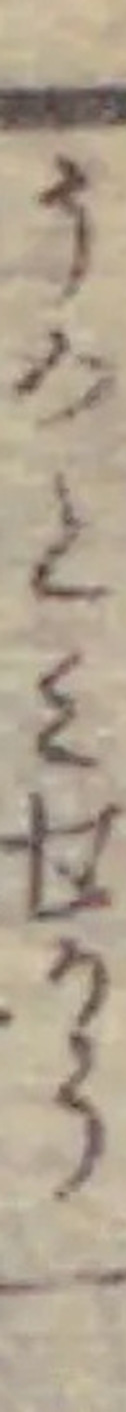うかとみせうら
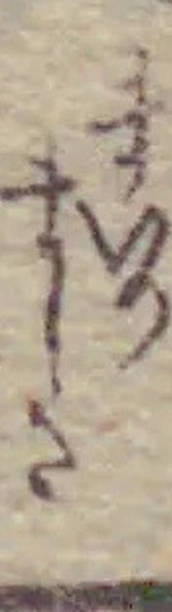まいり
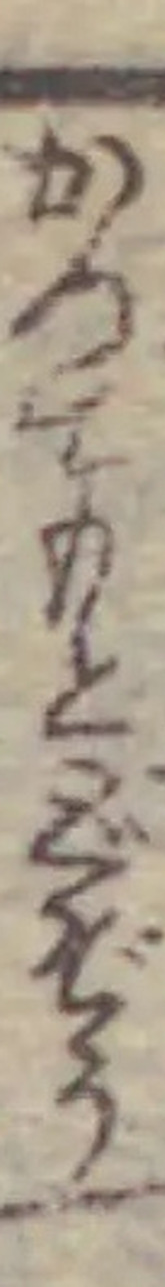かつてもとどぞう
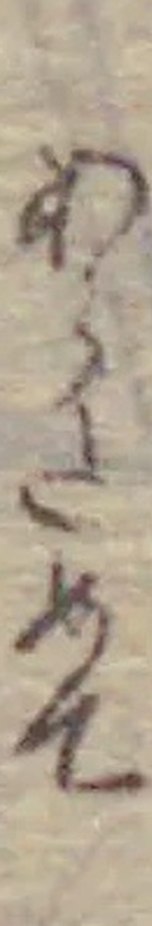あらためて
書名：化物大閉口 2巻
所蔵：国立国会図書館 National Diet Library, JAPAN
